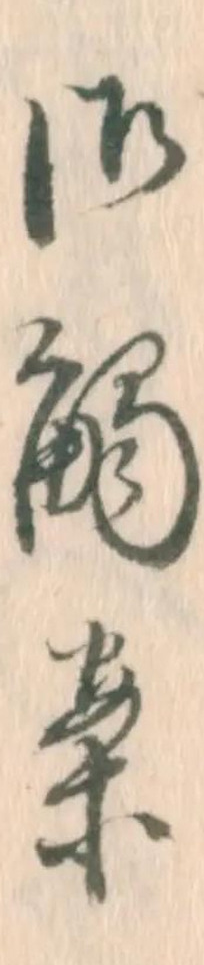御触案
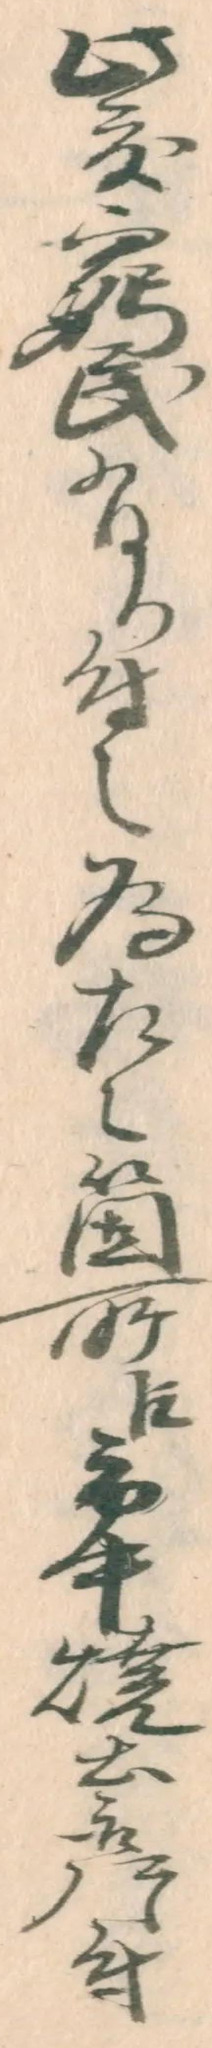此度窮民有り付の為左之箇所え市中焼土取片付
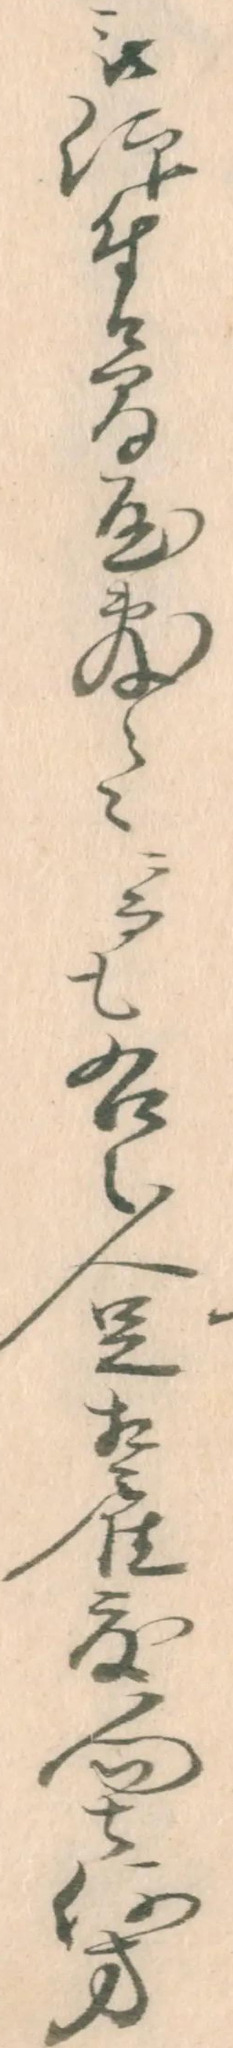被仰付候間屋敷〳〵ニては右之人足相雇度向は何方

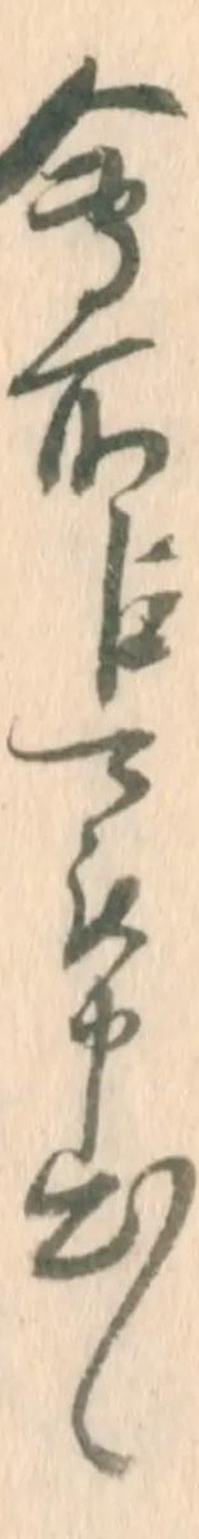会所え可被申出候
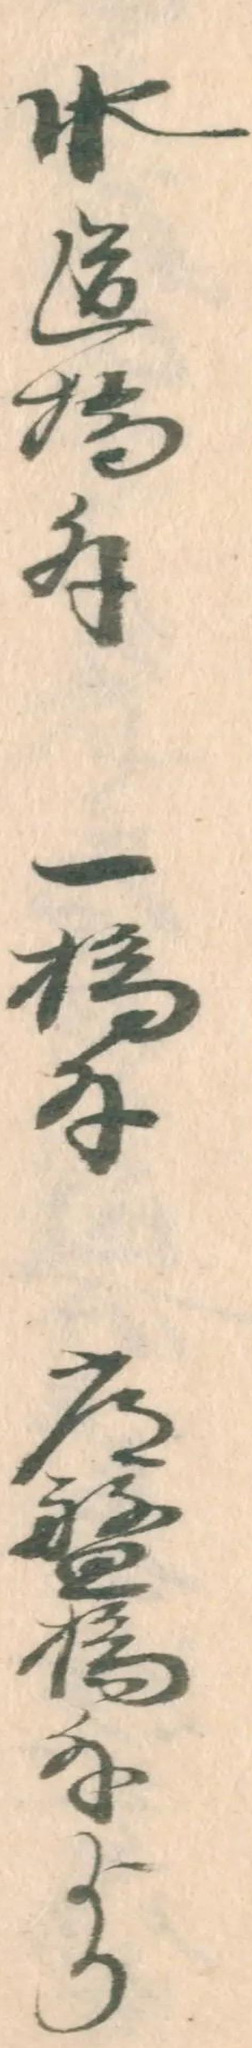水道橋外一橋外常盤橋外より
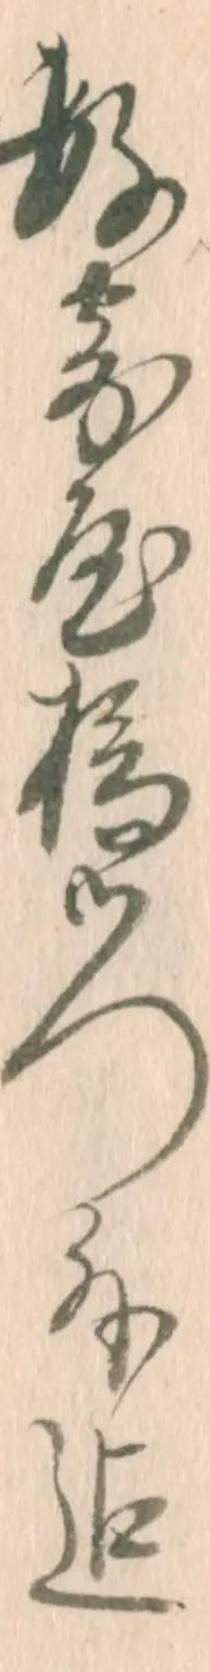数寄屋橋御門外迄
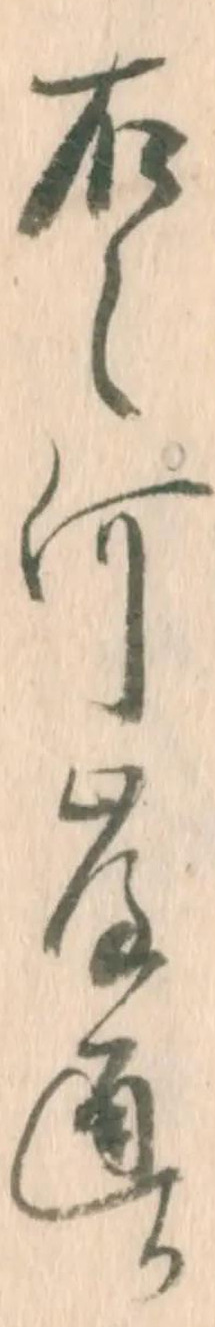右之河岸通り
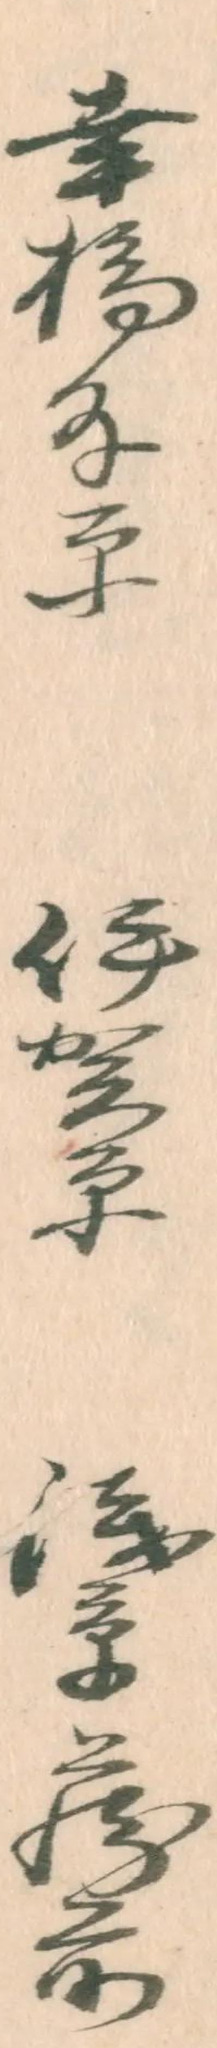幸橋外原伊賀原浅草蔵前
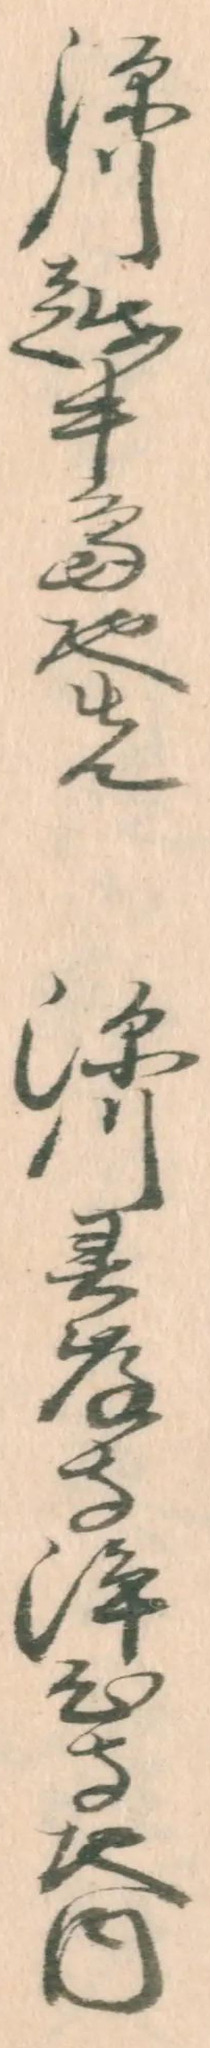深川越中島地先深川霊岸寺浄土寺地内
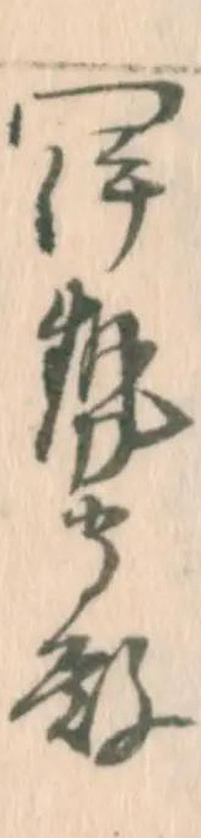│[伊㔟守殿
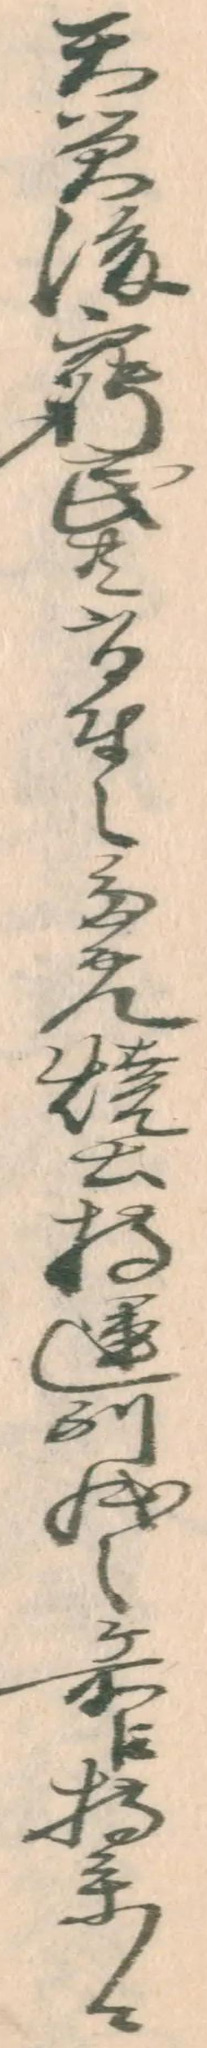天災後窮民共有付之ため焼土持運別紙之ケ所え持参候
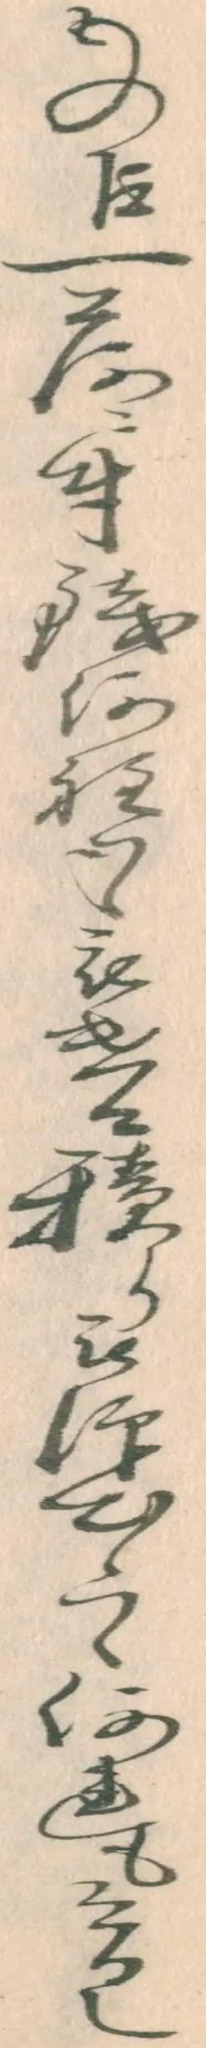ものえ一荷ニ付銭何程ツヽ被遣候積り被仰出候ハヽ何れも右之
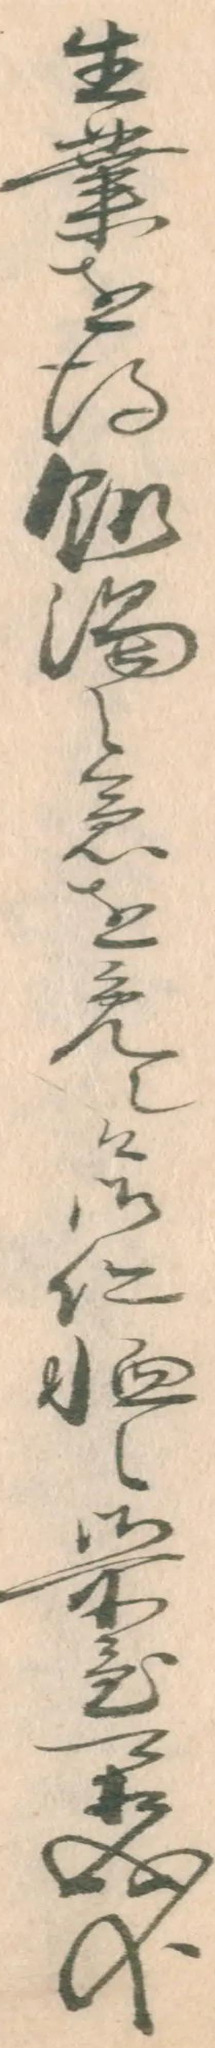生業を得飢渇之急を免レ候御仁恤之御所置可相成哉

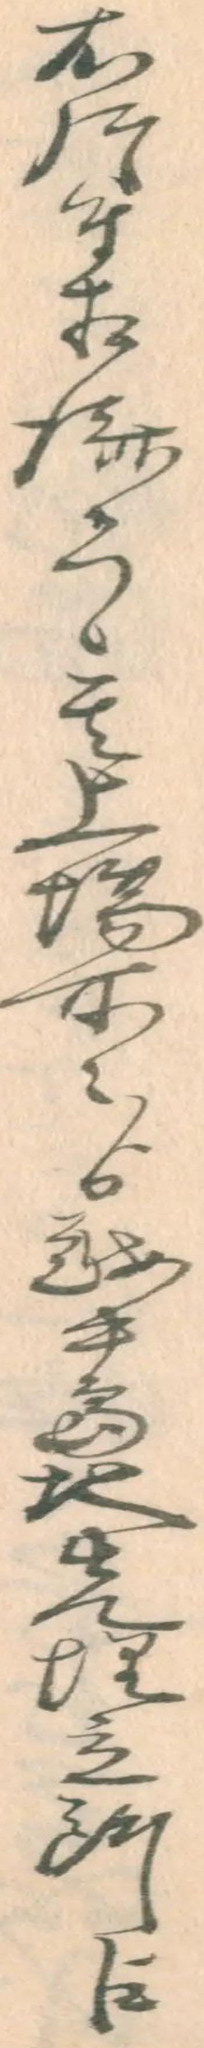右片付相済候ハヽ其上場所〻ゟ越中島地先埋立所え
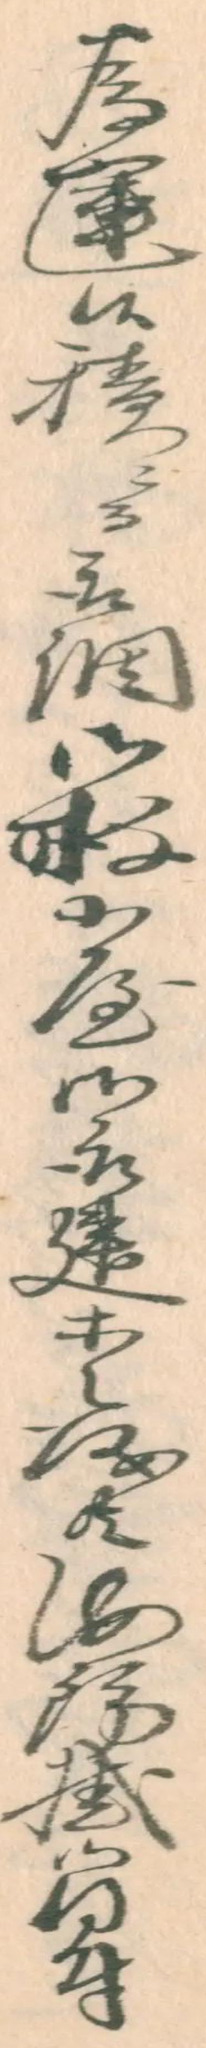為運候積ニて取調御救小屋御取立等之儀共海防掛御目付
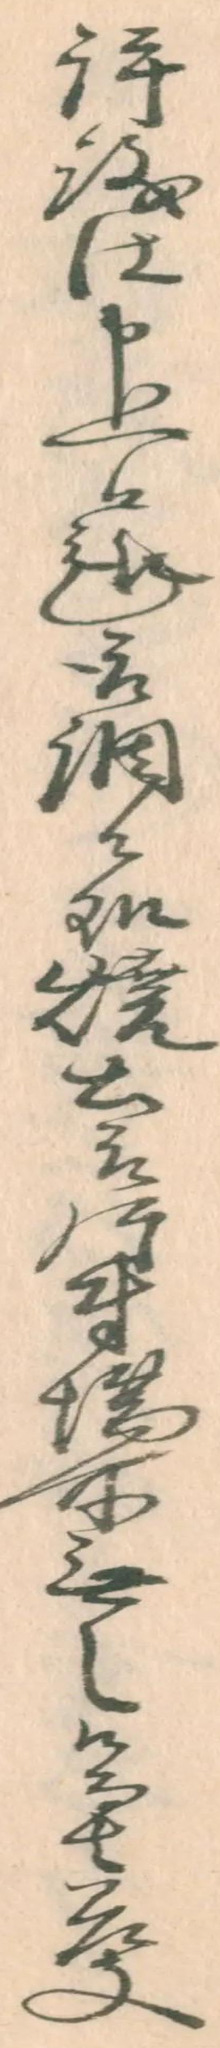評儀仕申上候趣調候処焼土取片付場所無之候ては差支
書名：地震災書留 2巻. [2] 内表紙に「地震一件　安政二卯年十月」とあり
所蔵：国立国会図書館 National Diet Library, JAPAN
